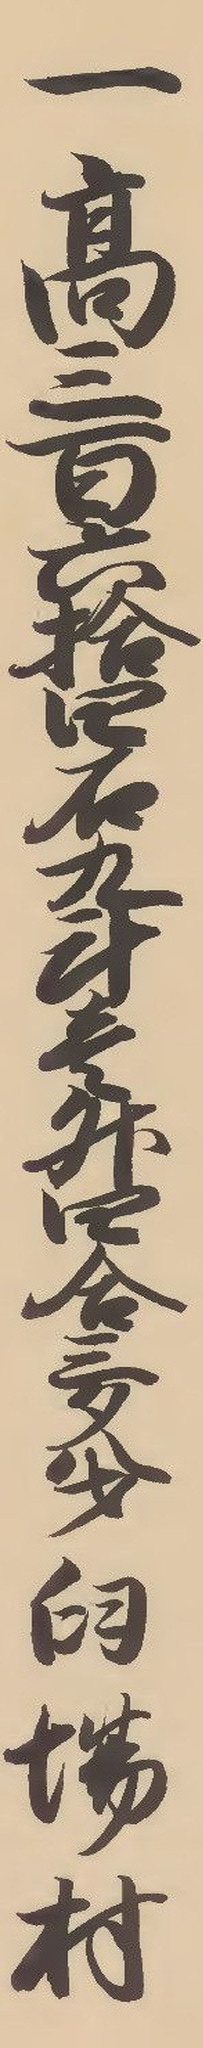一高三百六拾四石九斗壱升四合三勺八才臼場村
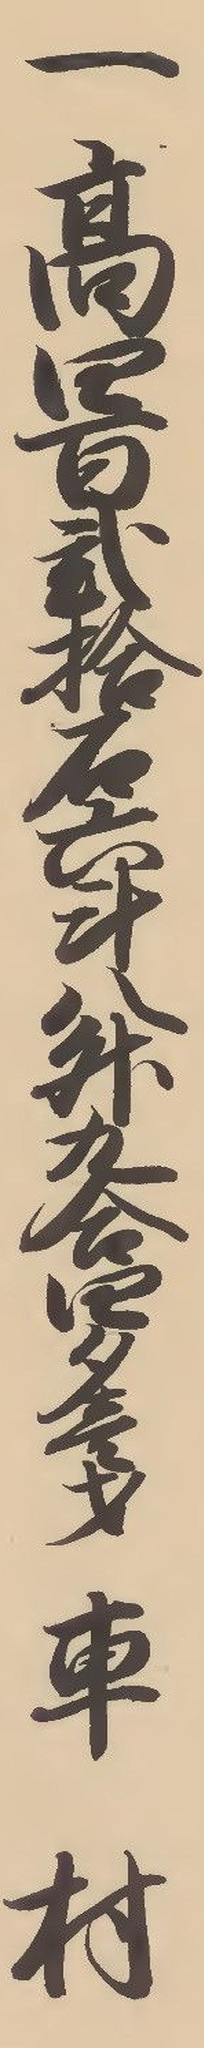一高四百弐拾石六斗八升九合四勺壱才車村
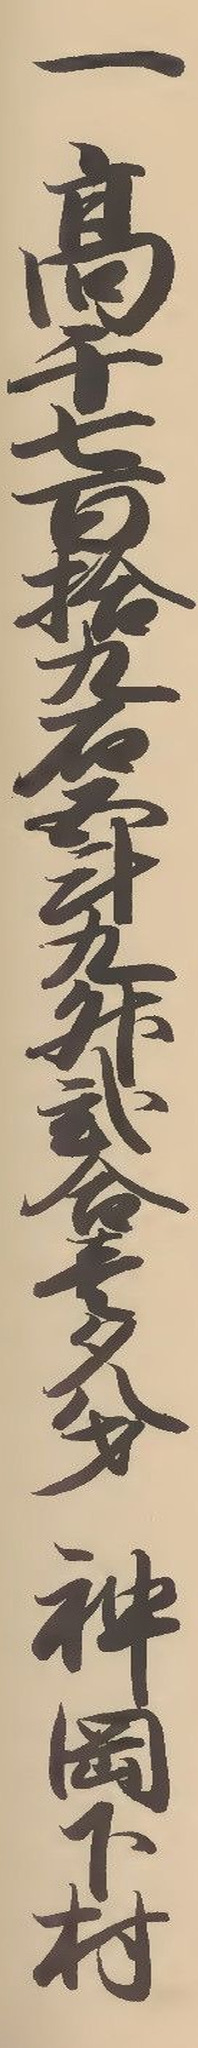一高千七百拾九石五斗九升弐合壱勺八才神岡下村
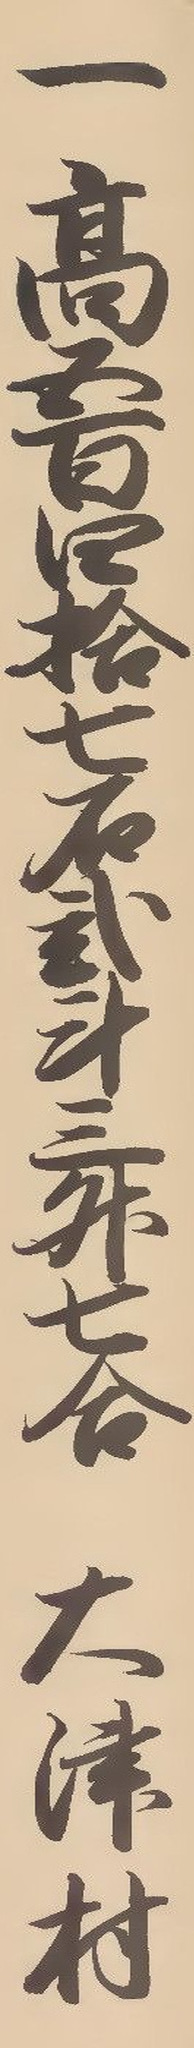一高五百四拾七石弐斗三升七合大津村
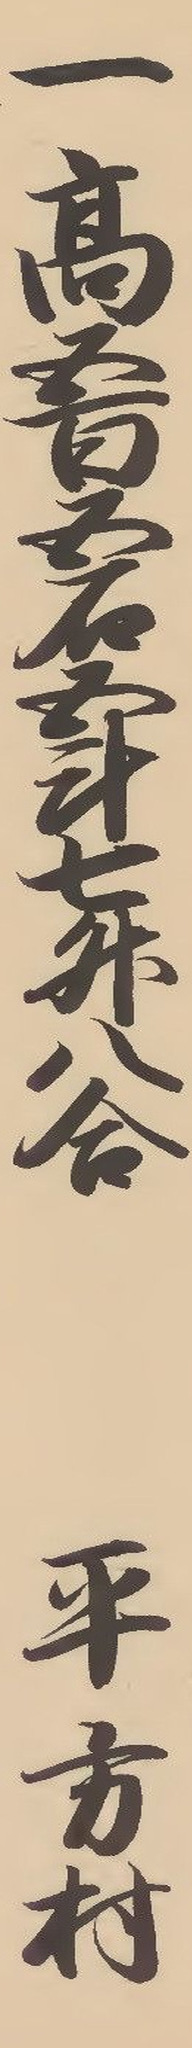一高五百五石五斗七升八合平方村
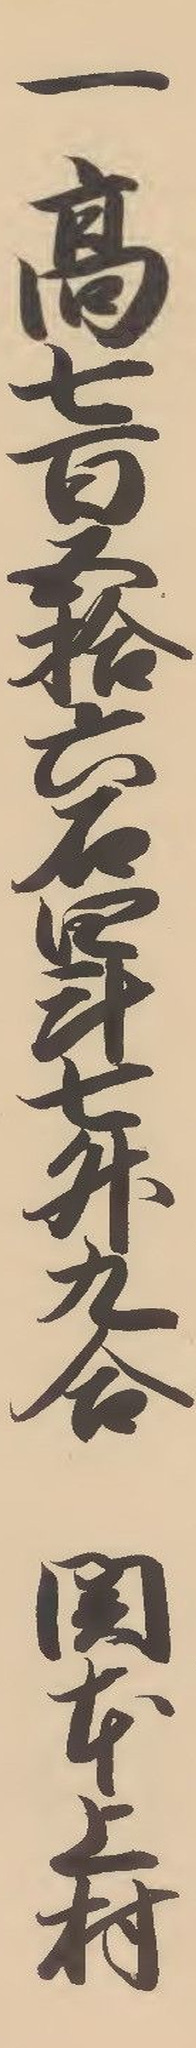一高七百五拾六石四斗七升九合関本上村
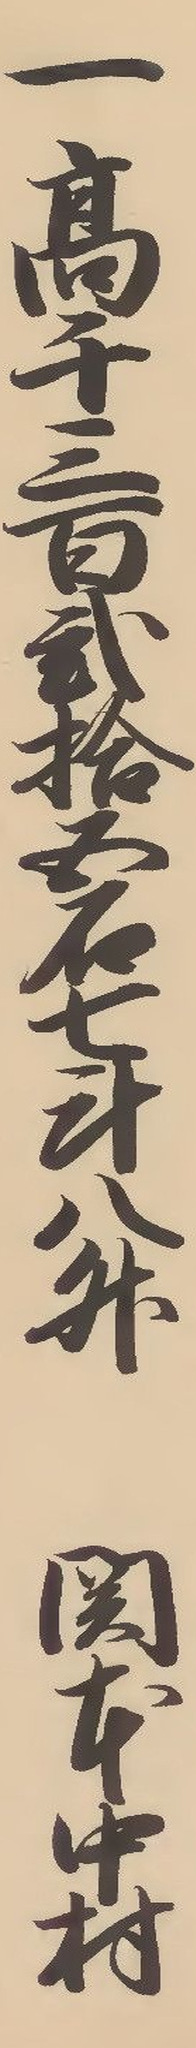一高千三百弐拾五石七斗八升関本中村

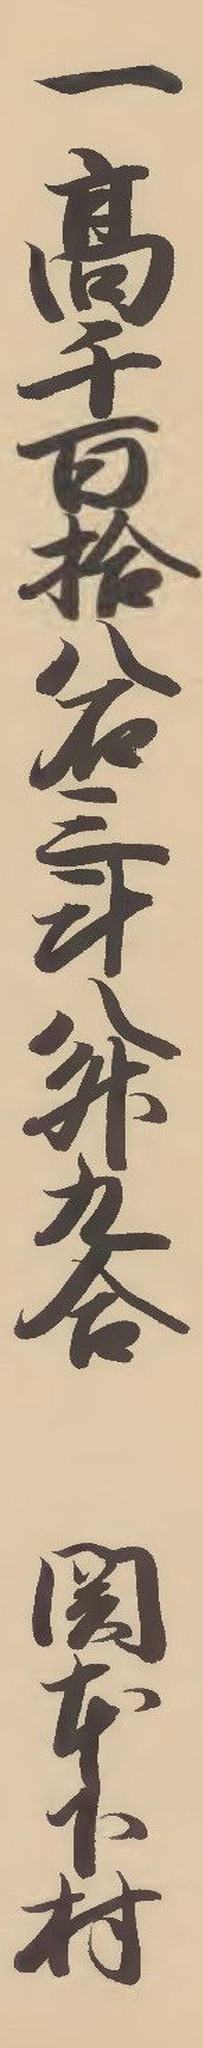一高千百拾八石三斗八升九合関本下村
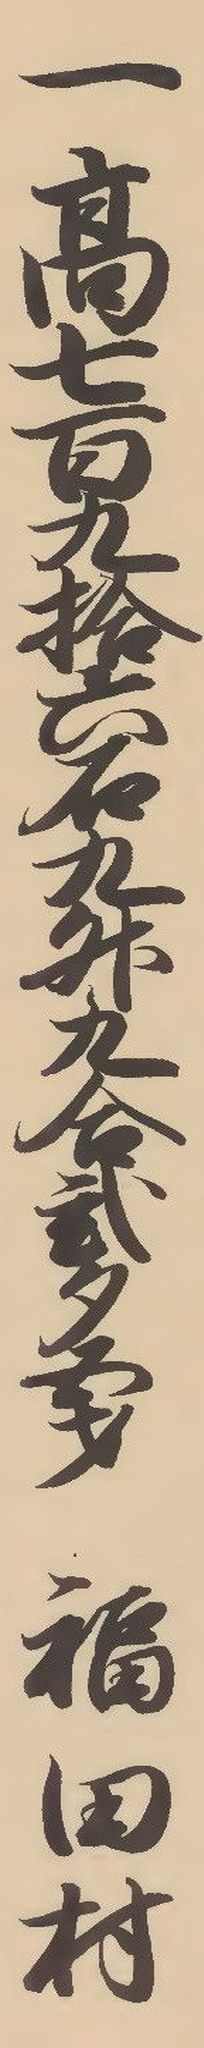一高七百九拾六石九升九合弐勺五才福田村
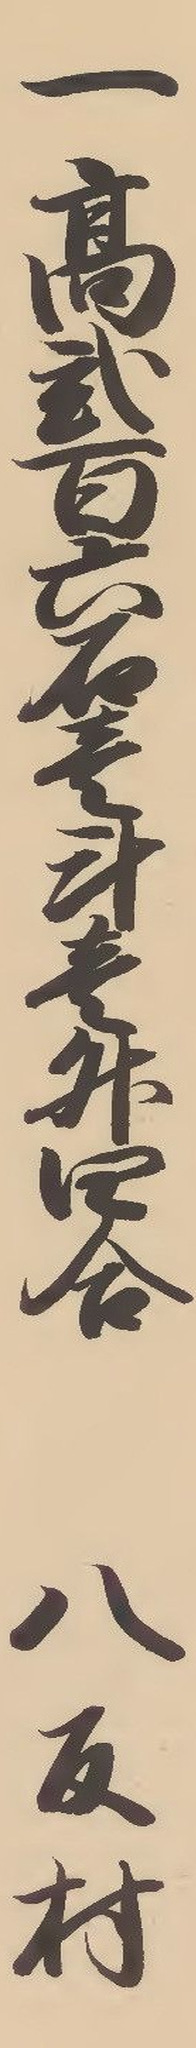一高弐百六石壱斗壱升四合八反村
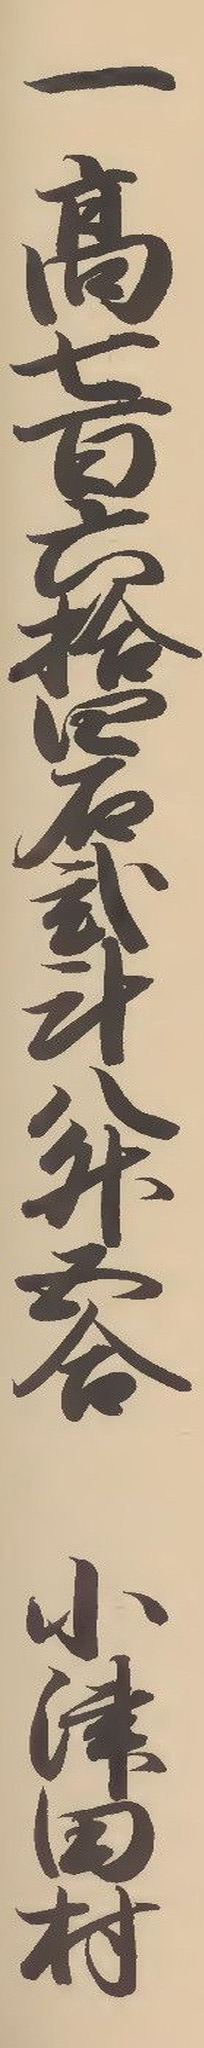一高七百六拾四石弐斗八升五合小津田村
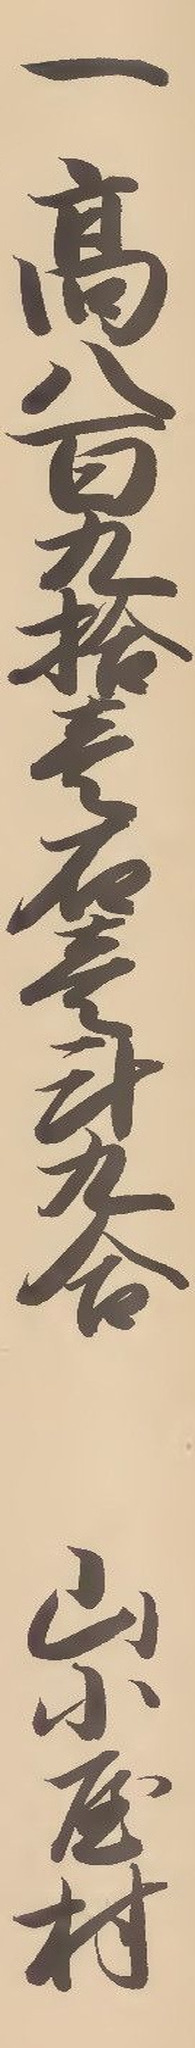一高八百九拾壱石壱斗九合山小屋村
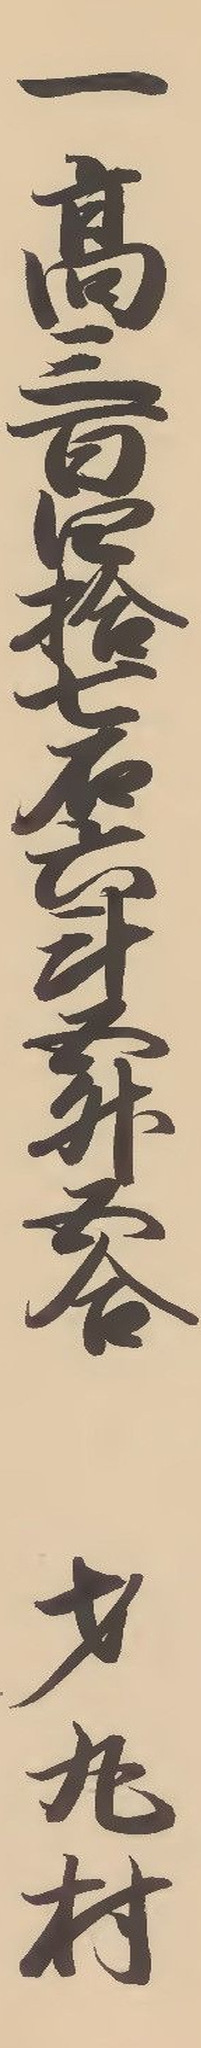一高三百四拾七石六斗五升五合才丸村
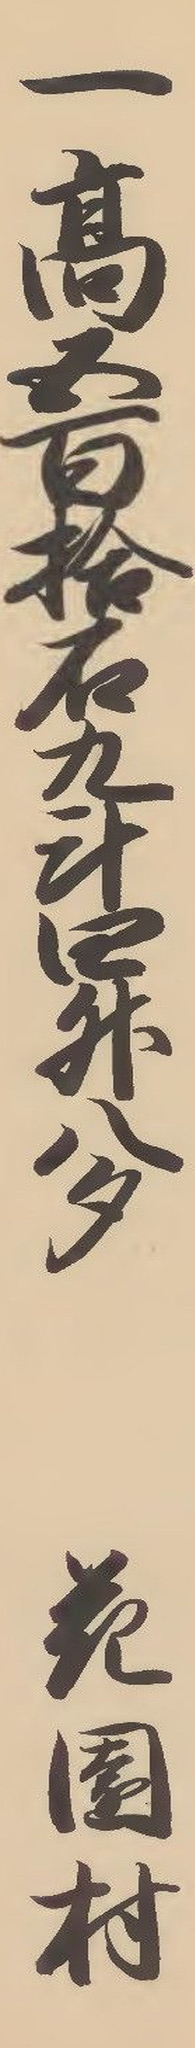一高五百拾石九斗四升八勺花園村

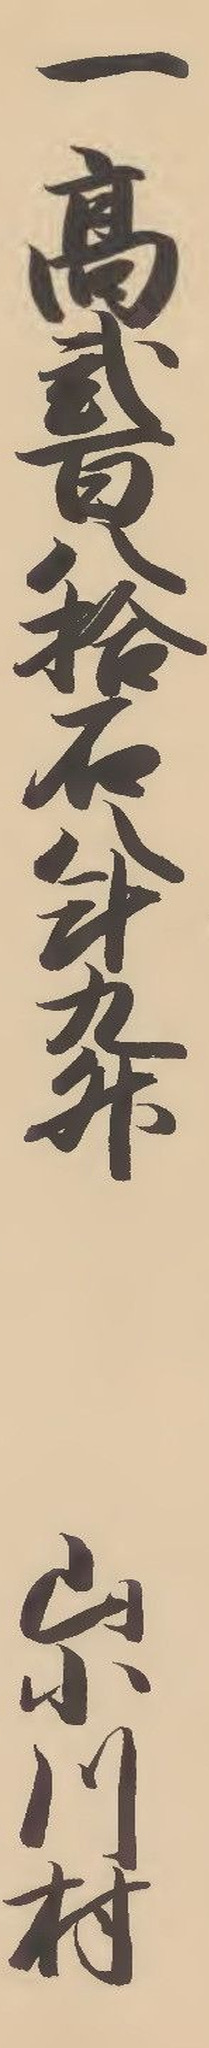一高弐百八拾石八斗九升山小川村
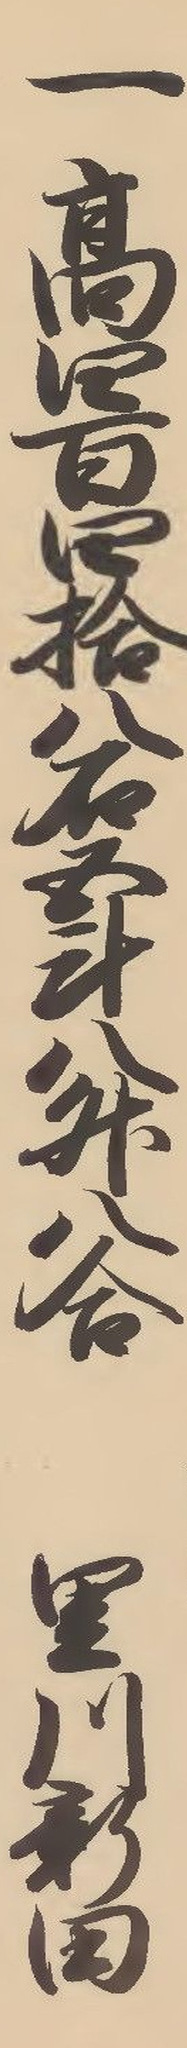一高四百四拾八石五斗八升八合里川新田
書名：常陸国郷帳
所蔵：国立公文書館 National Archives of Japan
